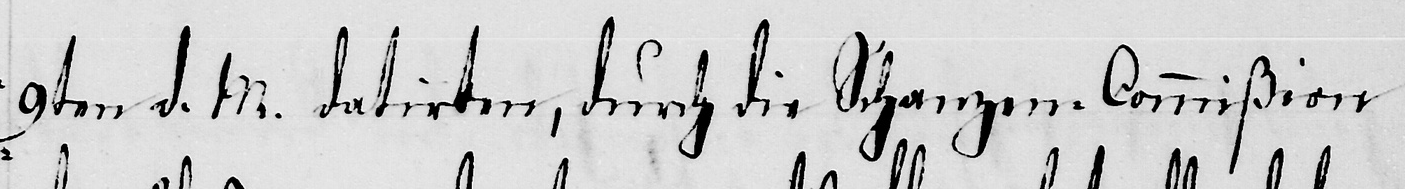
9ten d. M. datirten, durch die Schanzen-Commißion
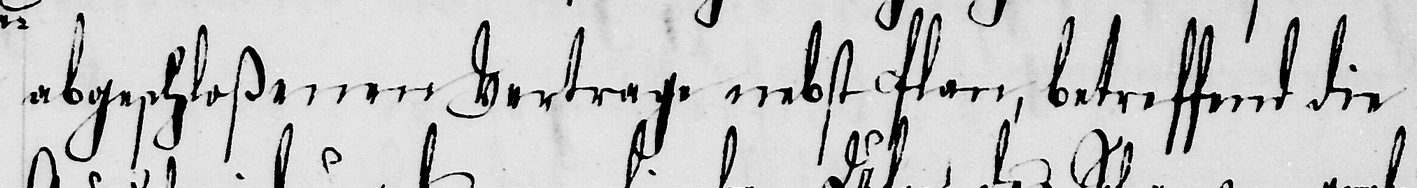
abgeschloßenen Vertrage nebst Plan, betreffend die
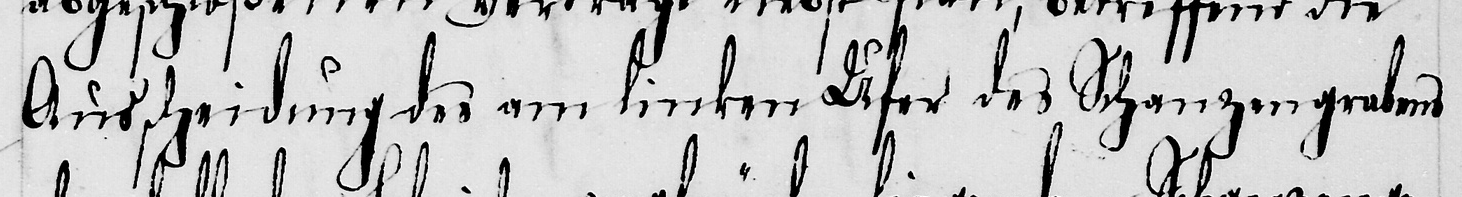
Ausscheidung des am linken Ufer des Schanzengrabens
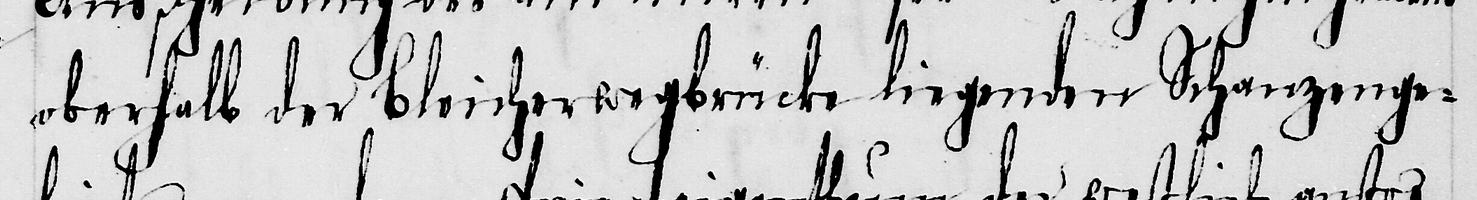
oberhalb der Bleicherwegbrücke liegenden Schanzenge¬
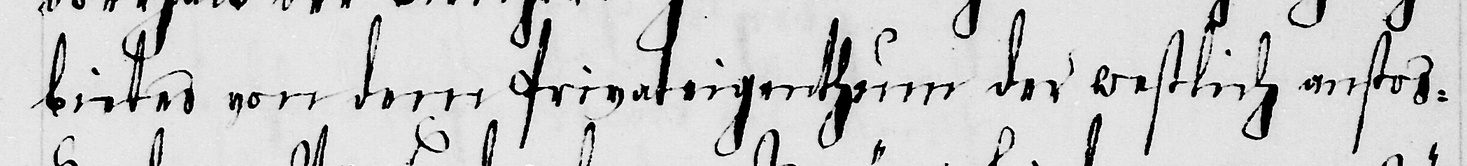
bietes von dem Privateigenthum der westlich ansto¬
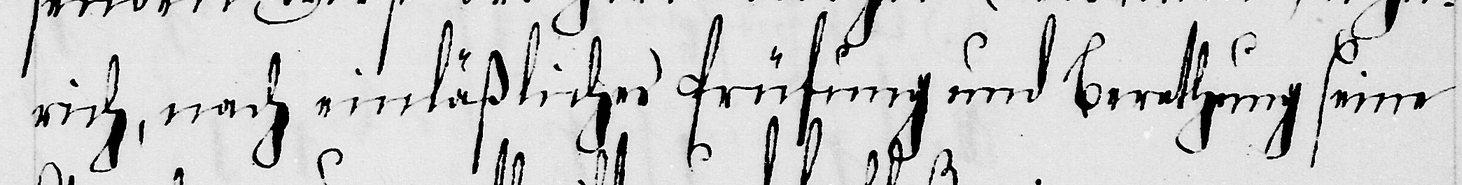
rich, nach einläßlicher Prüfung und Berathung seine
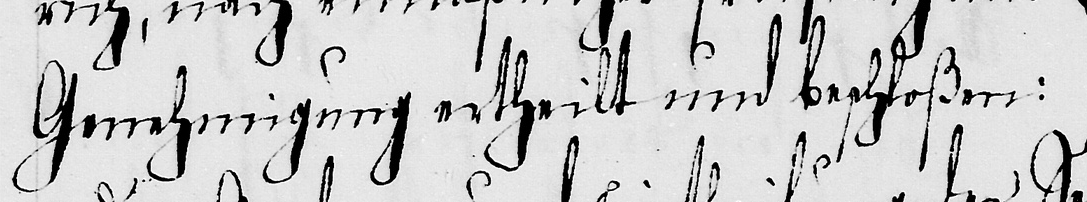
Genehmigung ertheilt und beschloßen:
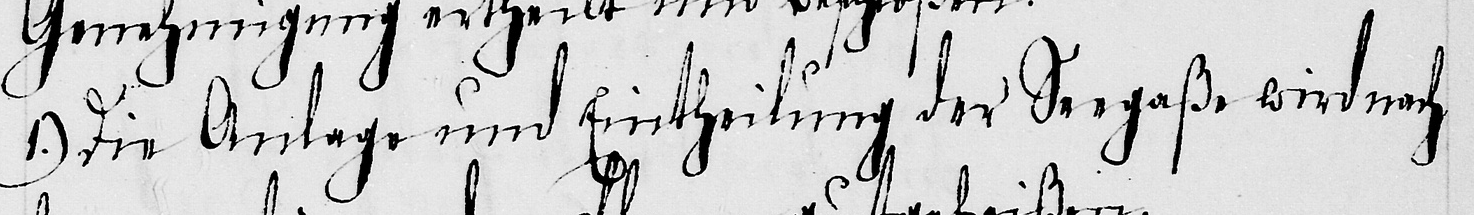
1.) Die Anlage und Eintheilung der Seegaße wird nach
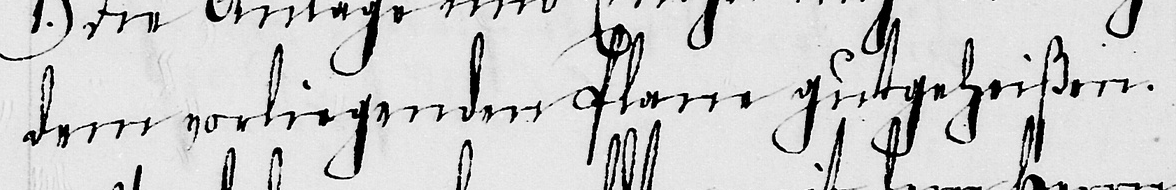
dem vorliegenden Plane gutgeheißen.
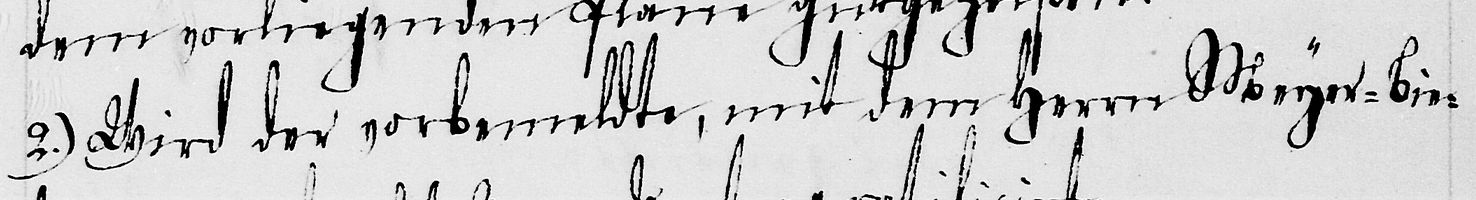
2.) Wird er vorbemeldte, mit dem Herrn Meyer-Bie¬
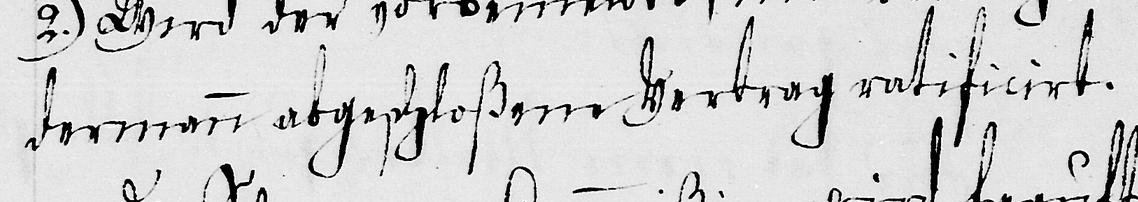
dermann abgeschloßene Vertrag ratificirt.
